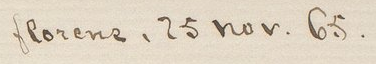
Florenz, 25 Nov. 65.
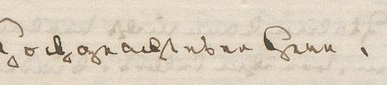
Hochgeachteter Herr,
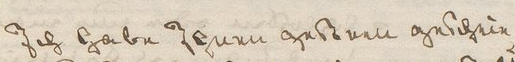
Ich habe Ihnen gestern geschrie-
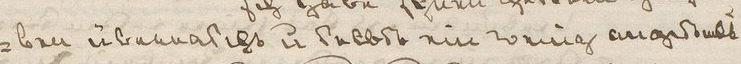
ben überrascht u selbst ein wenig angesteckt
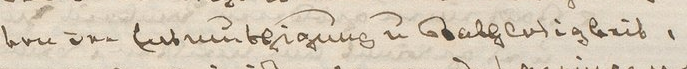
von der Entmuthigung u Rathlosigkeit,
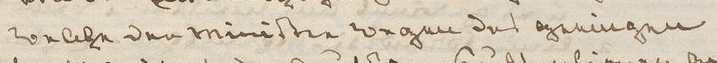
welche der Minister wegen des geringen
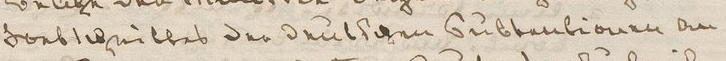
Fortschrittes der deutschen Subventionen an
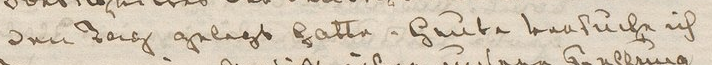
den Tag gelegt hatte. Heute versuche ich
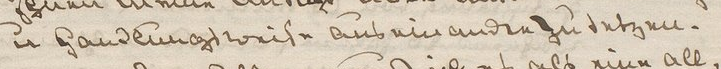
u Handlungsweise auseinanderzusetzen.
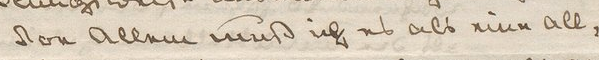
Vor Allem muß ich es als eine all-
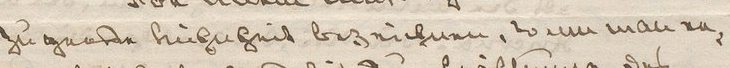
zu große Kühnheit bezeichnen, wenn man er-
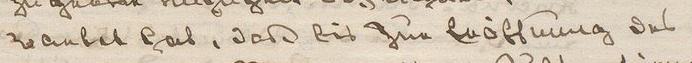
wartet hat, daß bis zur Eröffnung des
